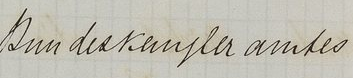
Bundeskanzleramtes,
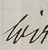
auch
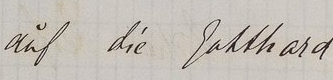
auf die Gotthard-
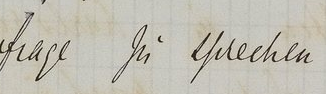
Frage zu sprechen
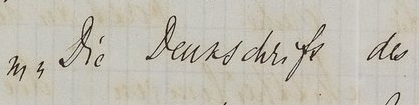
‹Die Denkschrift des
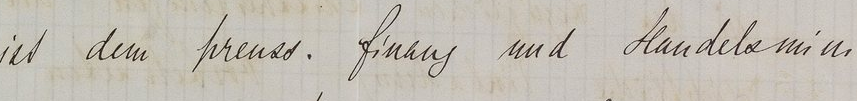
ist dem preuss. Finanz und Handelsmini-
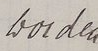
sterium zur
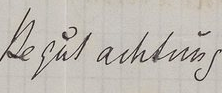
Begutachtung
